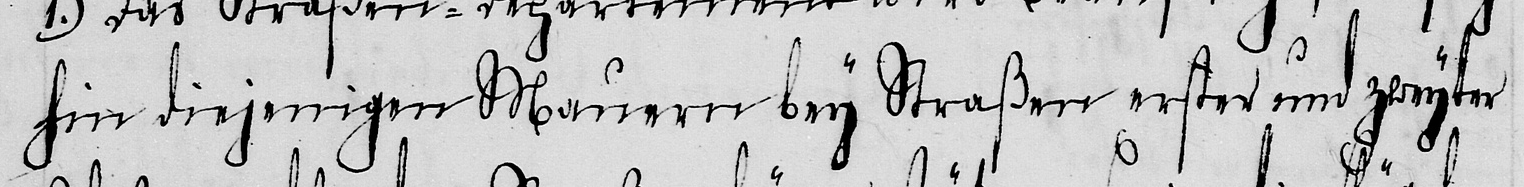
hin diejenigen Mauern bey Straßen erster und zweyter
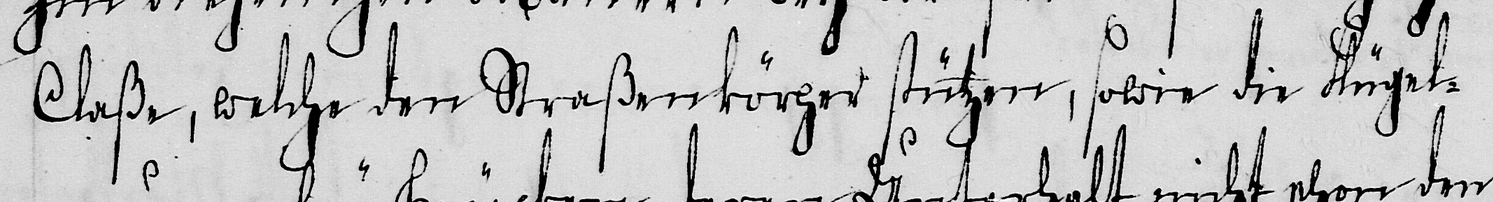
Claße, welche den Straßenkörper stützen, sowie die Flügel¬
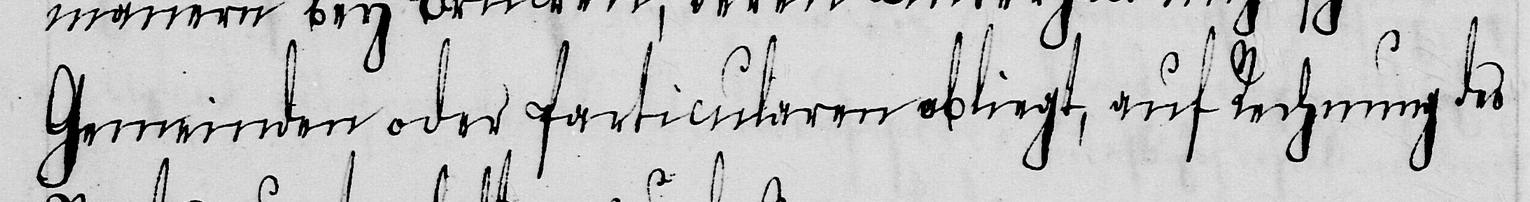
Gemeinden oder Particularen obliegt, auf Rechnung des
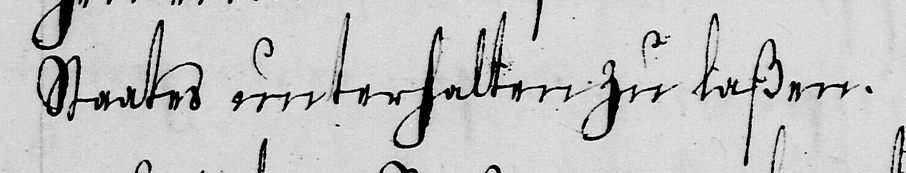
Staates unterhalten zu laßen.
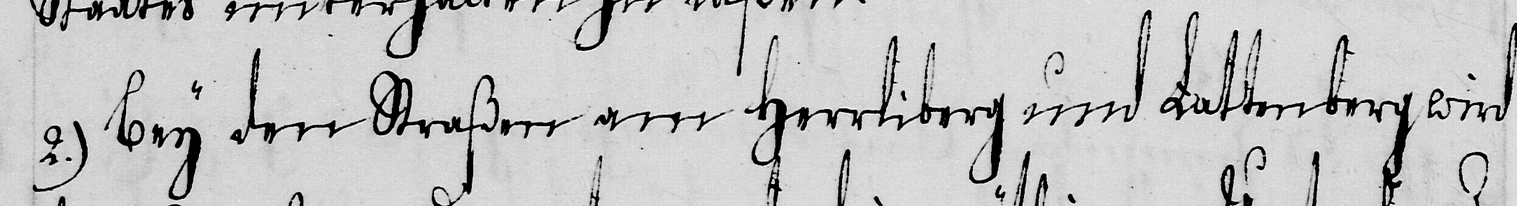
2.) Bey den Straßen am Herrliberg und Lattenberg wird
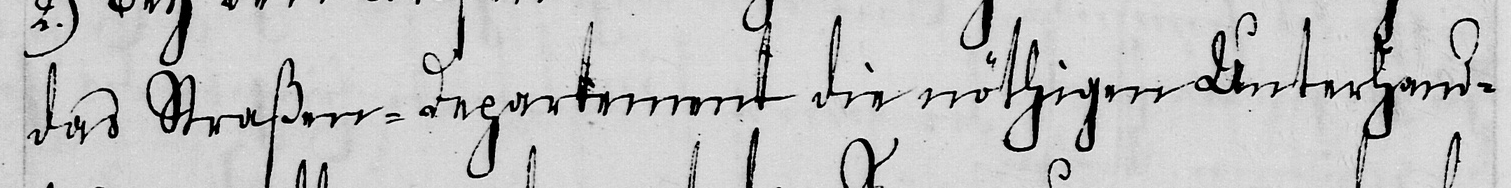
das Straßen-Departement die nöthigen Unterhand¬
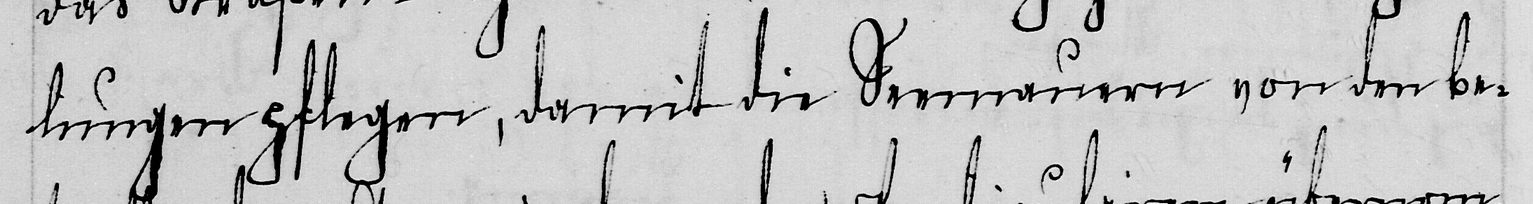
lungen pflegen, damit die Seemauern von den be¬
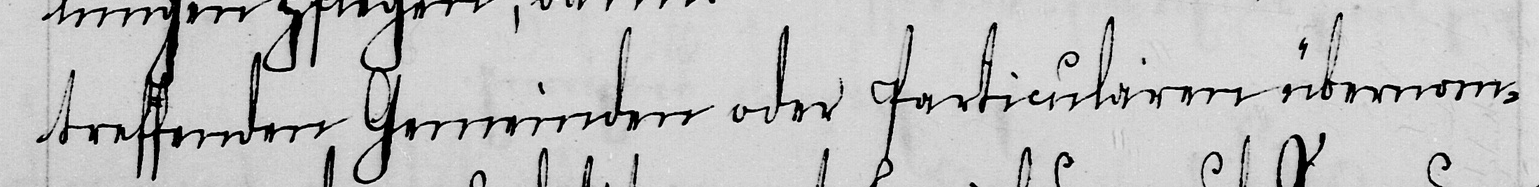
treffenden Gemeinden oder Particularen übernom¬
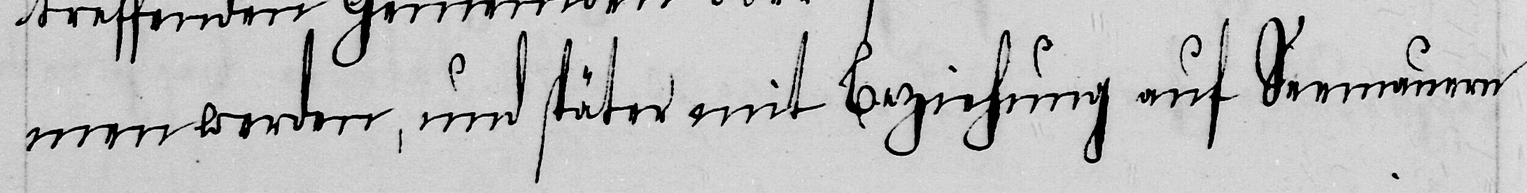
men werden, und später mit Beziehung auf Seemauern
